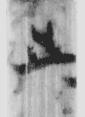之
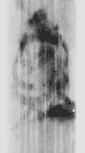監
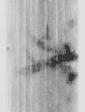之
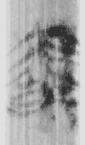{尒䎽}
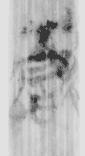{人言系}
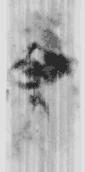{目人}
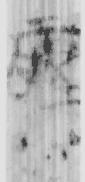聖
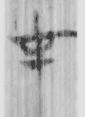才
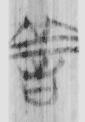善
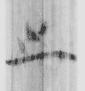之
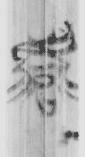{鹿君}
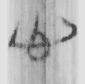心
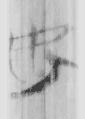𡚦
